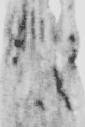羕（咏）
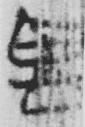思
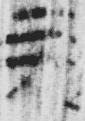而
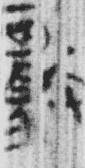○（動）
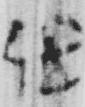心
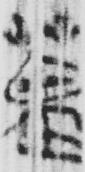○（喟）
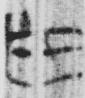女（如）
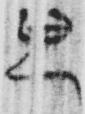也
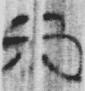亓（其）
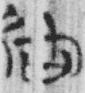居
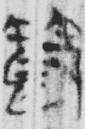節
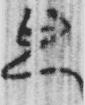也
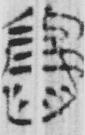舊（久）
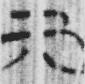亓（其）
